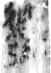遇（寓）
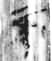不
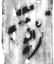可
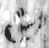㠯（以）
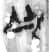凡
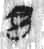宮
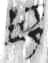垑
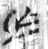於
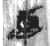西
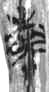南
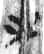之
